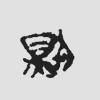則
